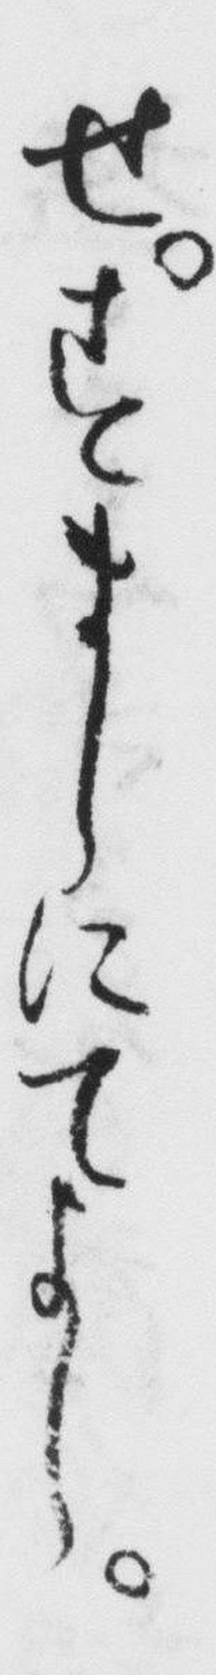せ。すましにてよし。
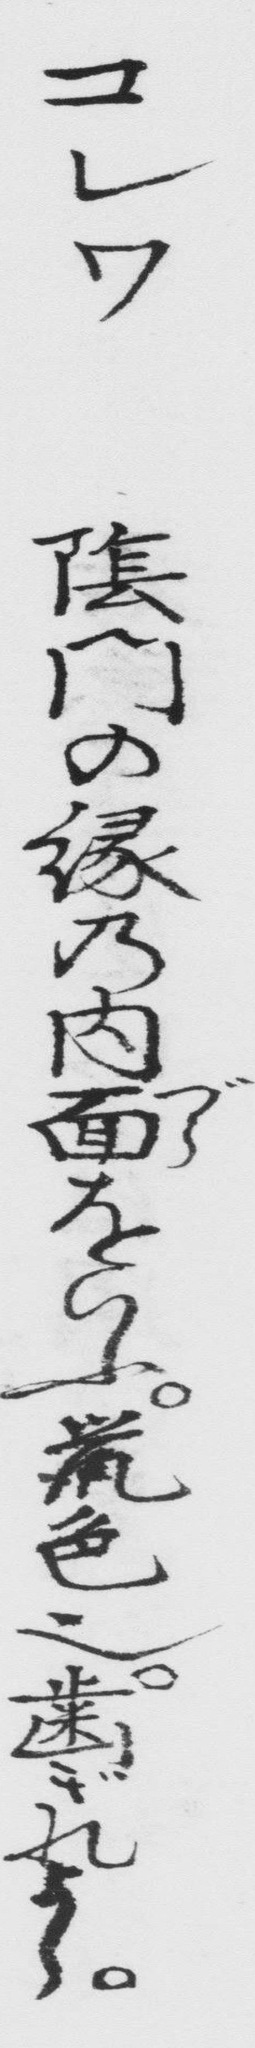コレワ陰門の縁の内面をいふ。鼠色也。歯ぎれよし。

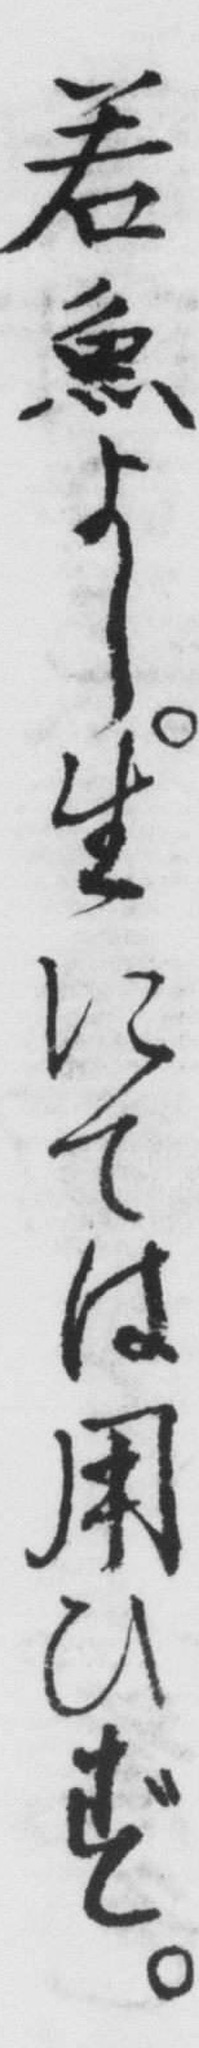若魚よし。生にては用ひず。
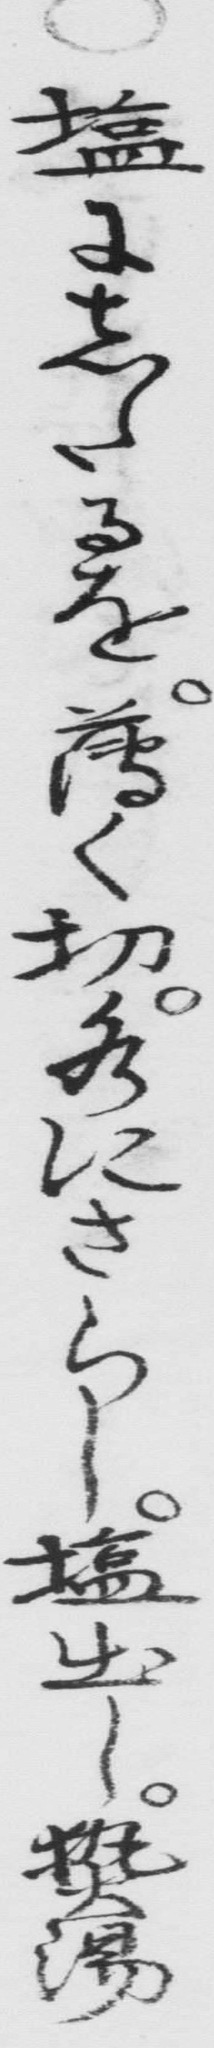○塩にしたるを。薄く切。水にさらし。塩出し。熱湯
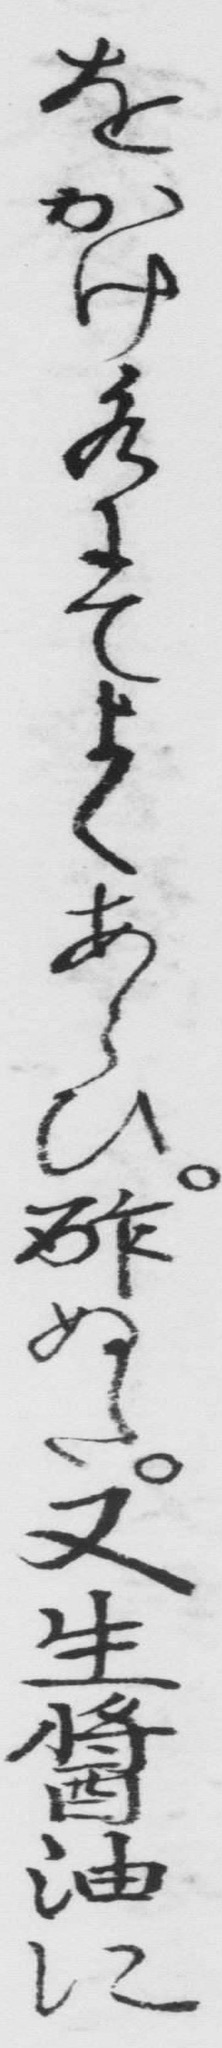をかけ水にてよくあらひ。酢ぬた。又生醤油に
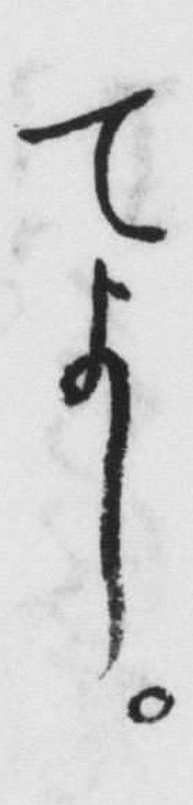てよし。
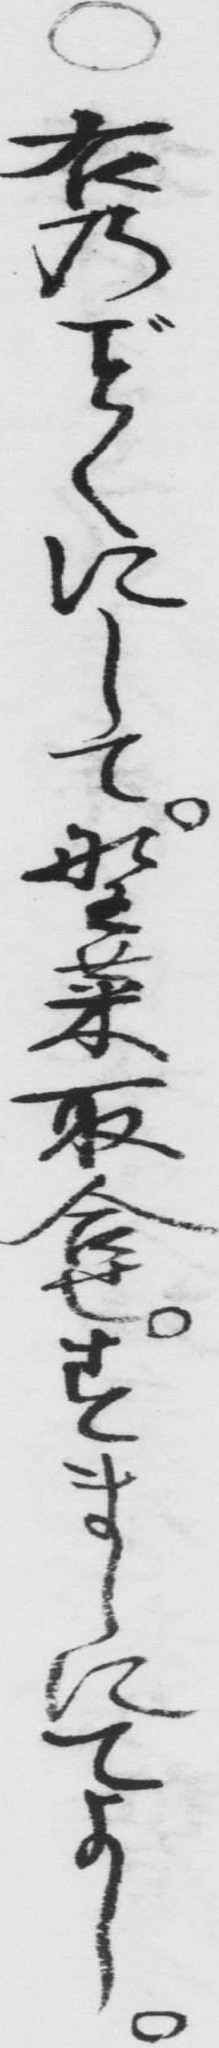○右のごとくにして。野菜取合せ。すましにてよし。
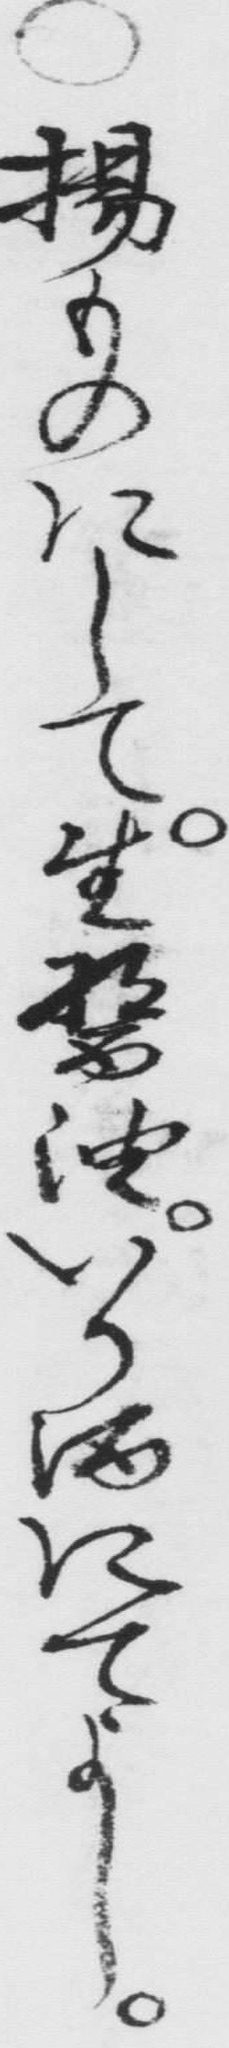○揚ものにして。生醤油。いり酒にてよし。
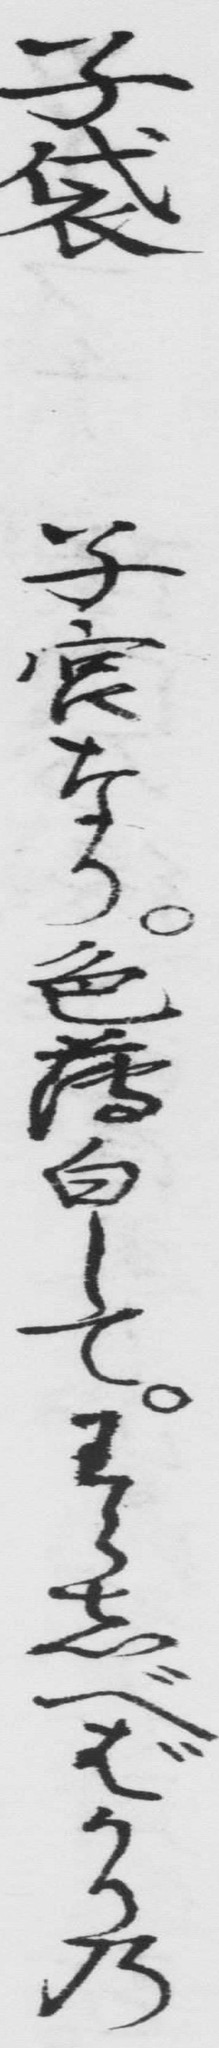子袋子宮なり。色薄白して。わらしべばかりの
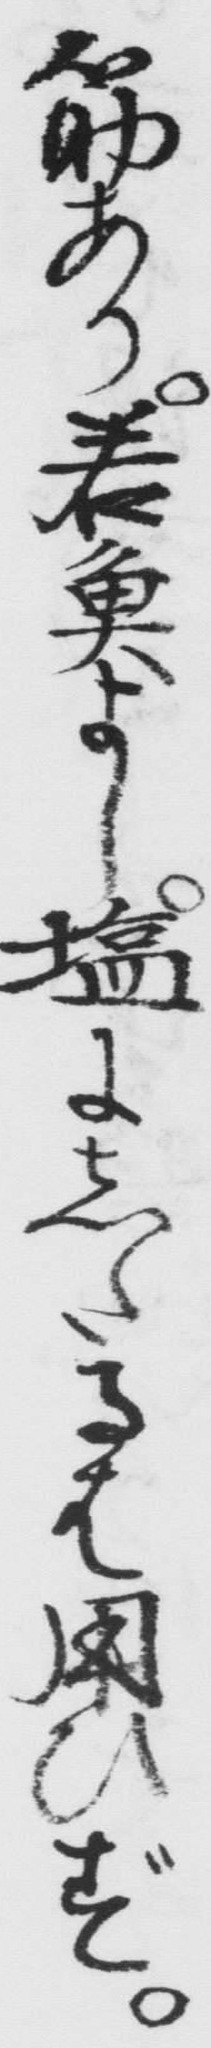筋あり。若魚よし。塩にしたるは用ひず。
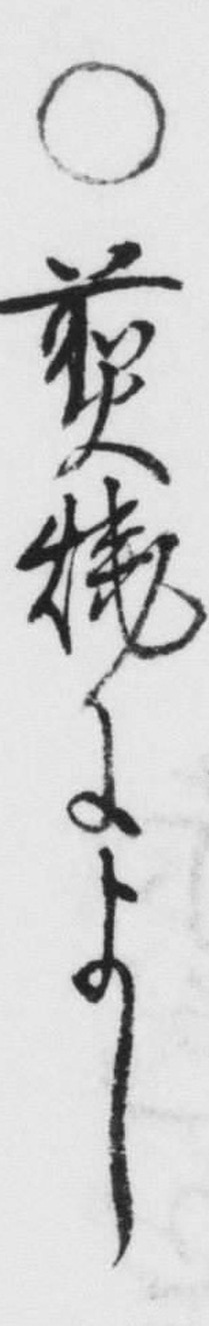○煎焼によし。
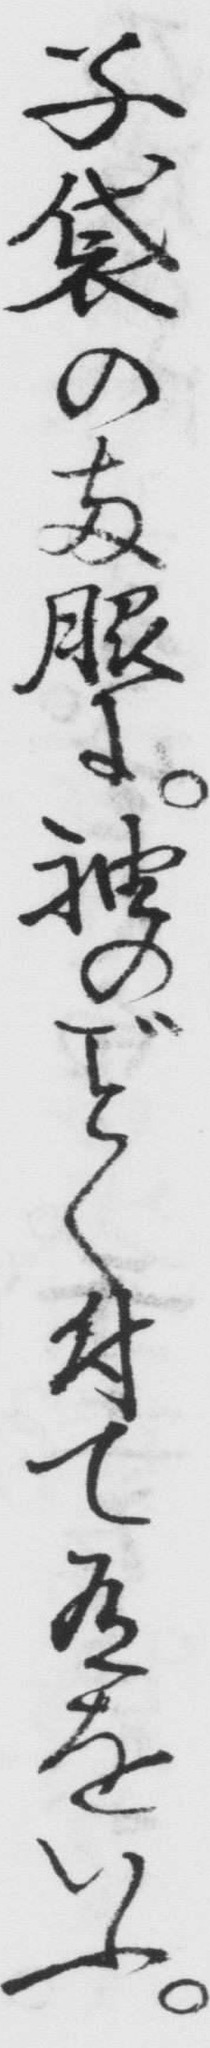ソデ子袋の両脇に。袖のごとく付て有をいふ。
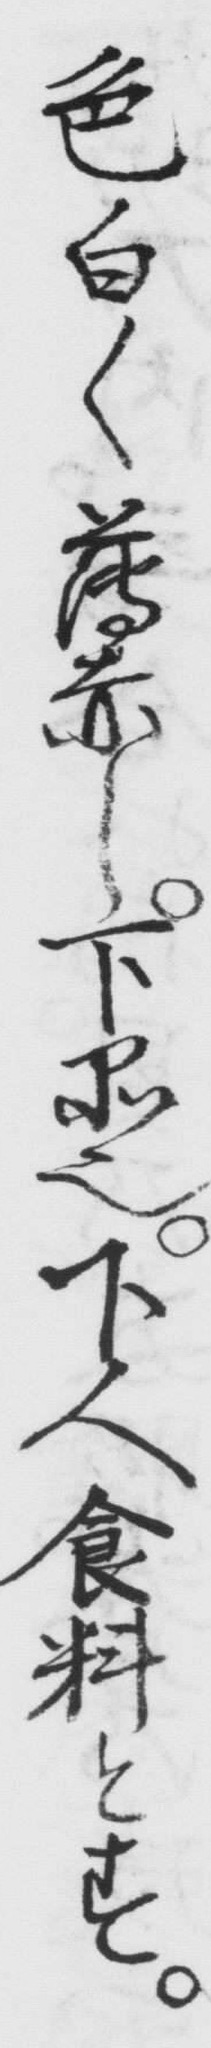色白く薄赤し。下品也。下人食料とす。
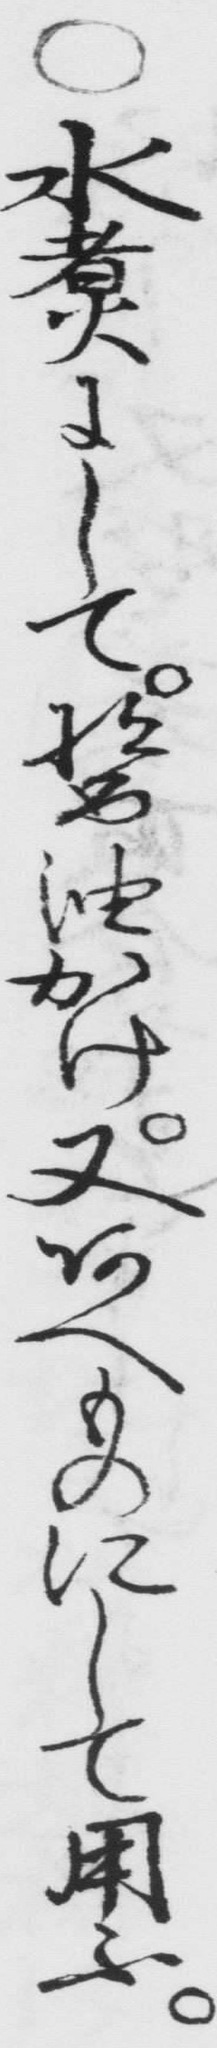○水煮にして。醤油かけ。又あへものにして用ふ。
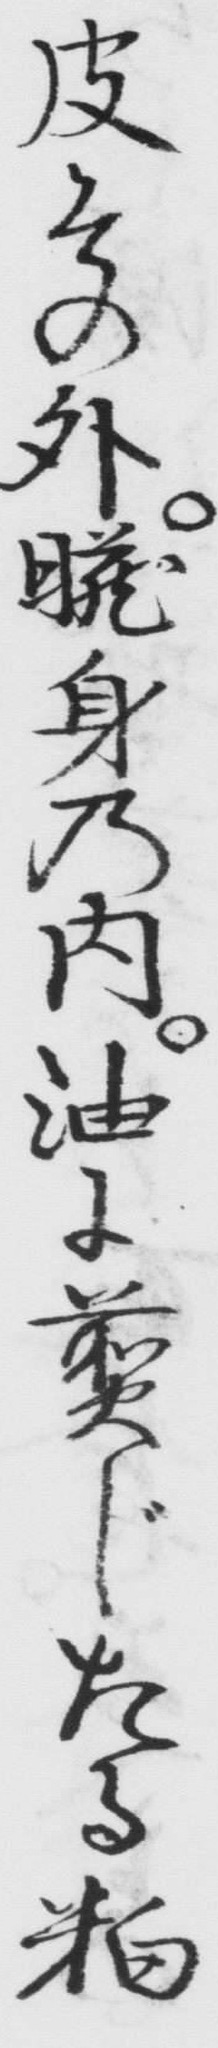煎粕皮その外。臓身の内。油に煎じたる粕
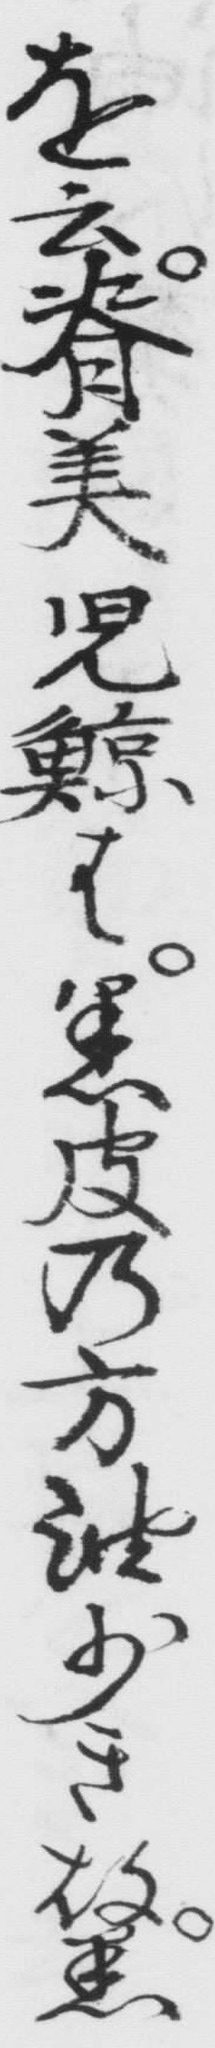を云。背美児鯨は。黒皮の方油少き故。黒
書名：鯨肉調味方
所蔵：大阪府立大学学術情報センター 国文学研究資料館
